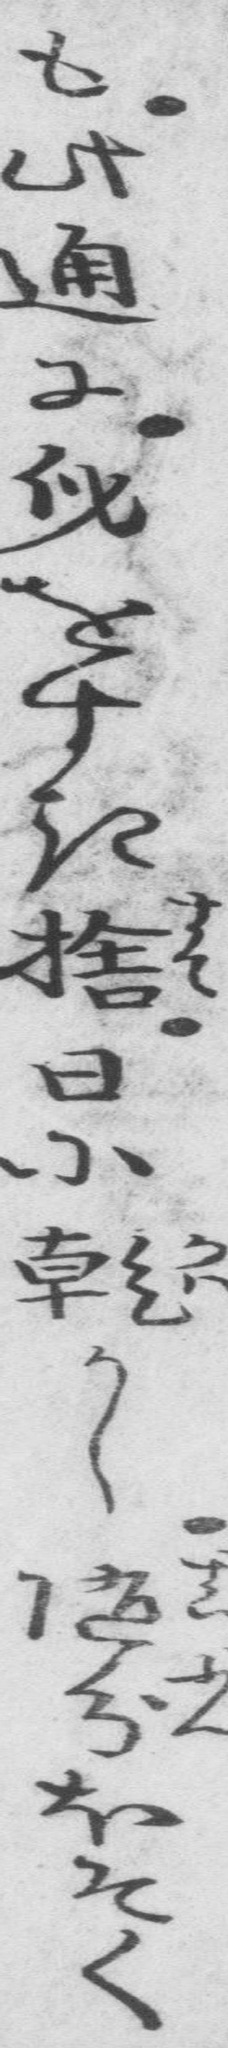も。此通に。身をすき捨。日に乾かし。随分ほそく
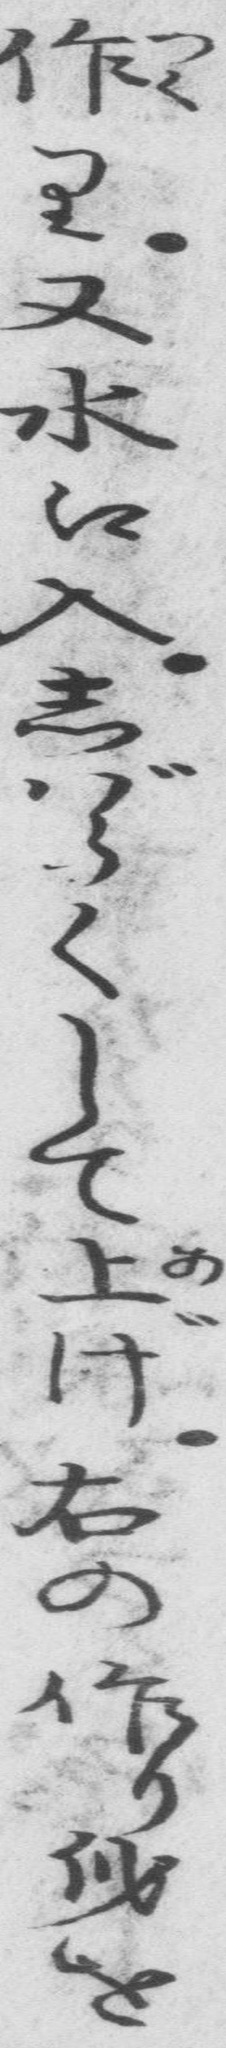作り。又水え入。しばらくして上げ。右の作り身を
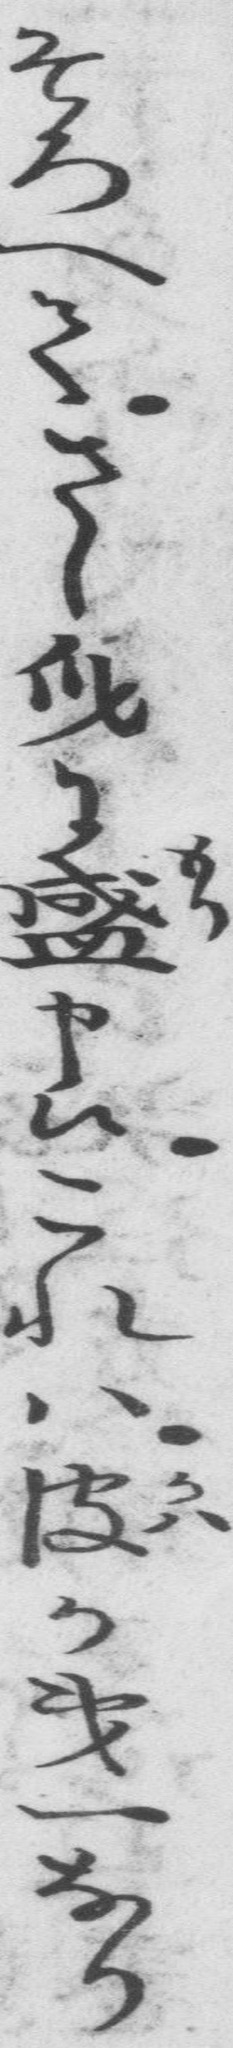そろへて。さし身に盛申候。これは。皮か第一なり
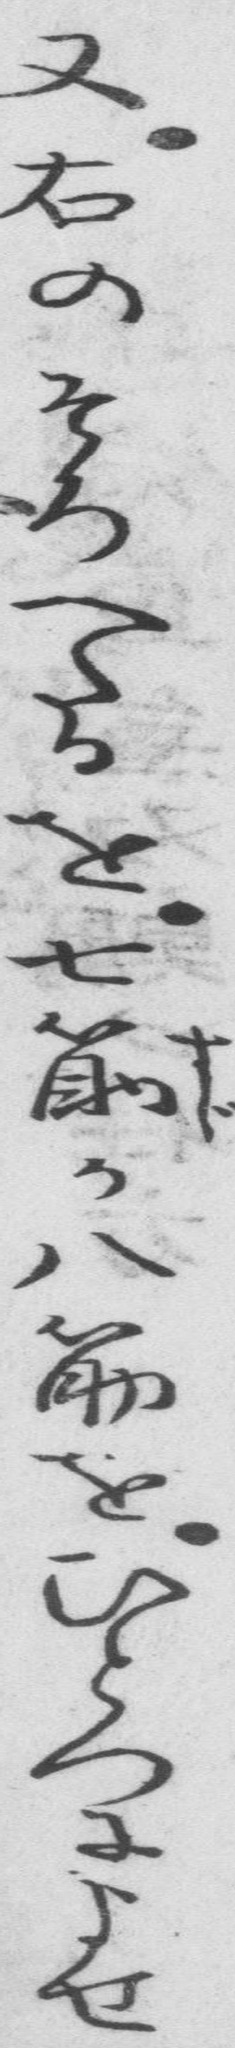又。右のそろへたるを。七筋か八筋を。ひとつによせ
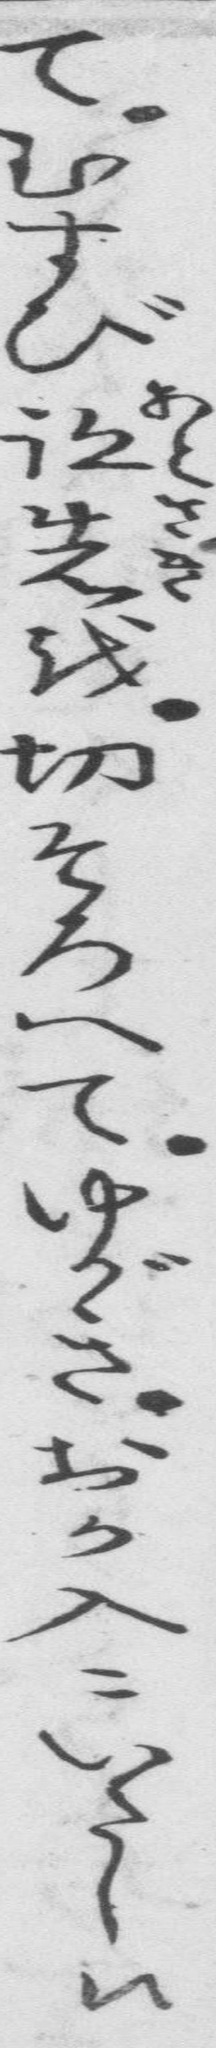て。むすび跡先を。切そろへて。ゆがき。おか入にいたし候
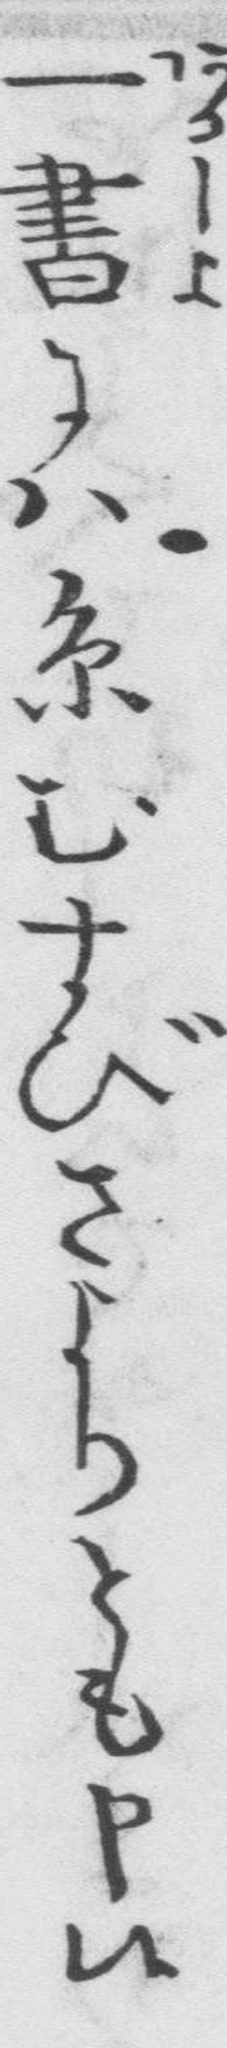一書には。糸むすびさよりとも申候
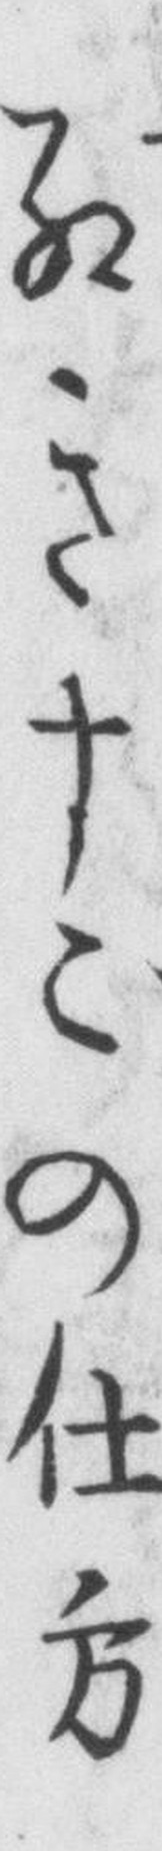紅きすごの仕方
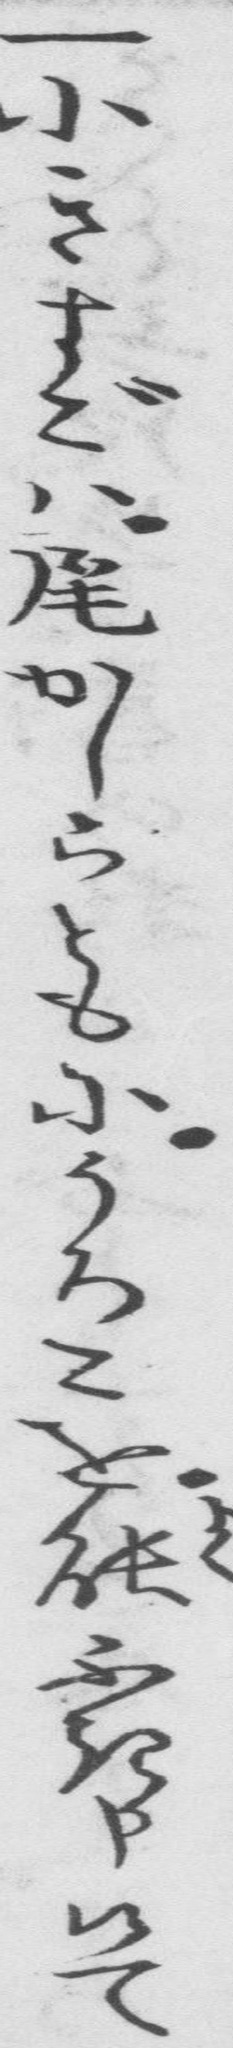一小きすごは。尾かしらともに。うろこを。能ふき申候て
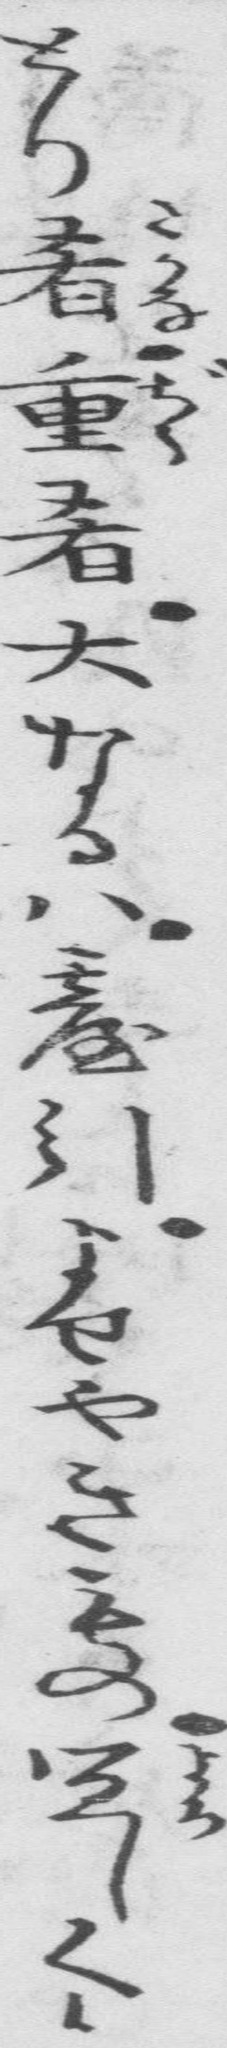とり肴。重肴。大なるは。台引。よせやきもの。宜しく候
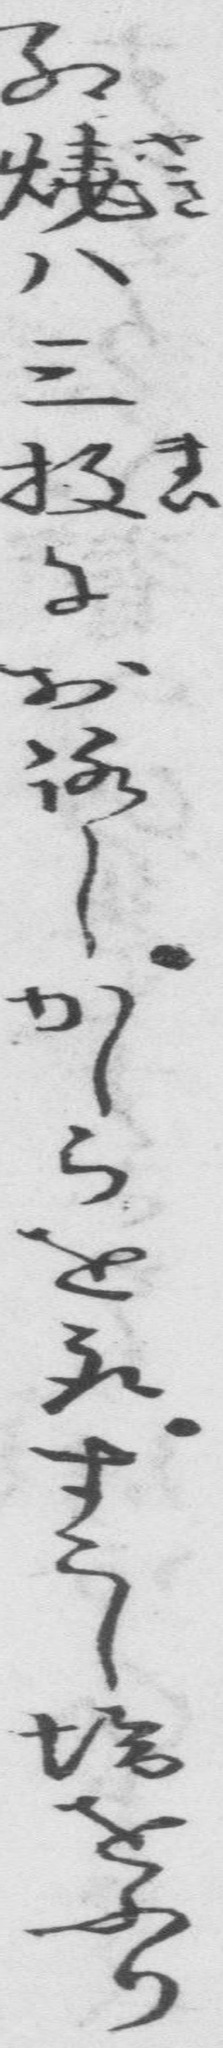紅焼は三枚におろし。かしらを取。すこし塩をふり
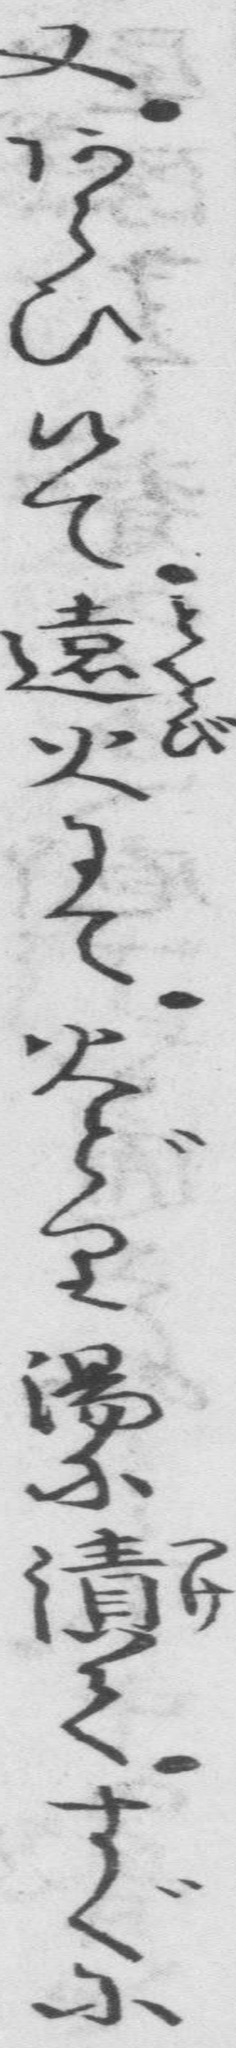又。あらひ候て。遠火にて。火どり湯に漬て。すぐに
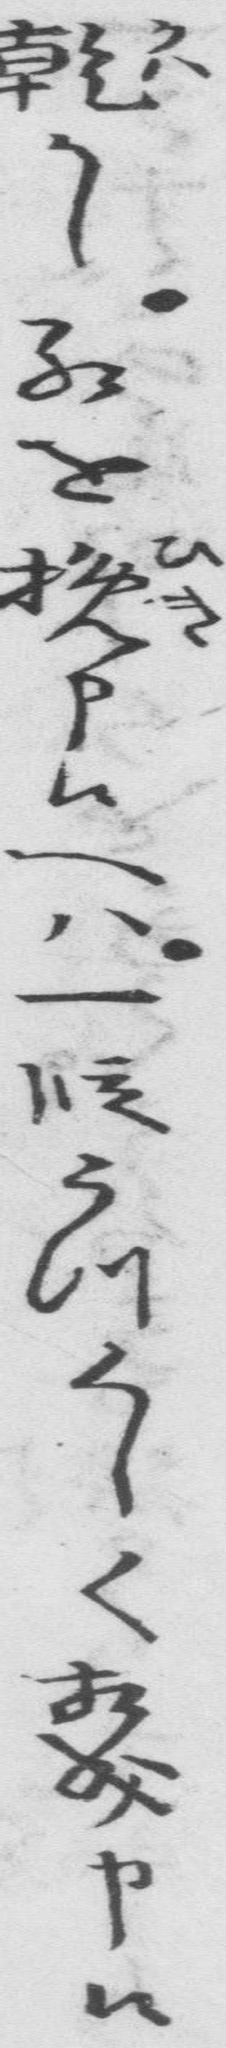乾かし。紅を挽申候へは。一段うつくしく相成申候
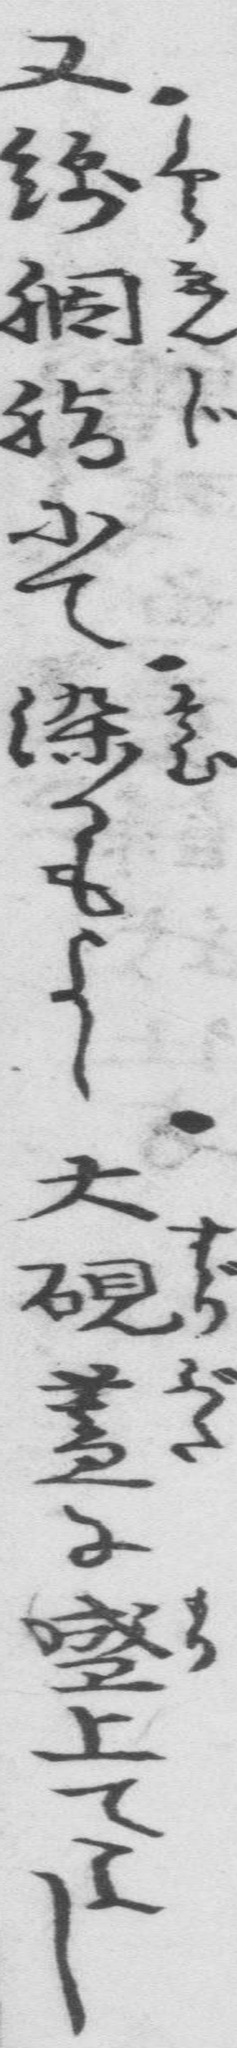又。錦胭脂にて。染るもよし。大硯蓋に盛上てよし

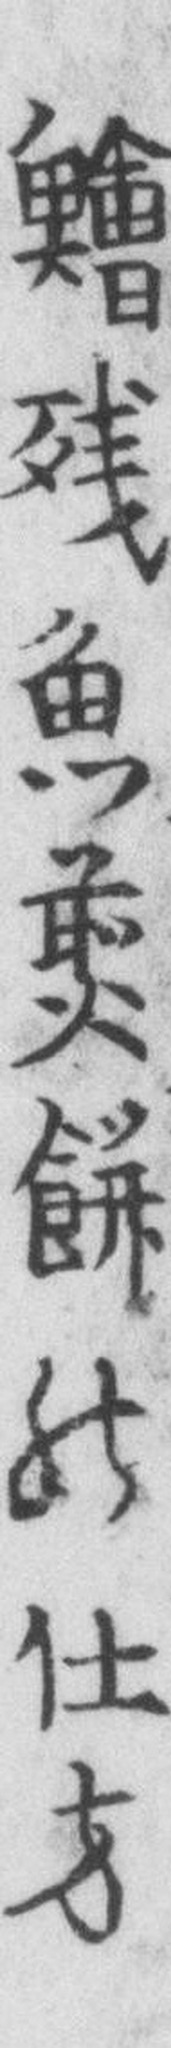鱠残魚煎餅の仕方
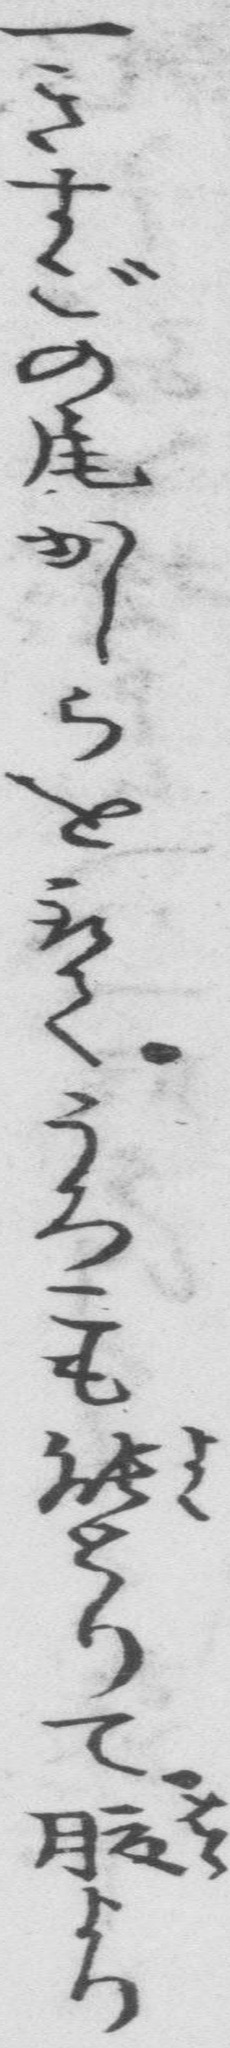一きすごの尾かしらを取て。うろこも能とりて。腹より
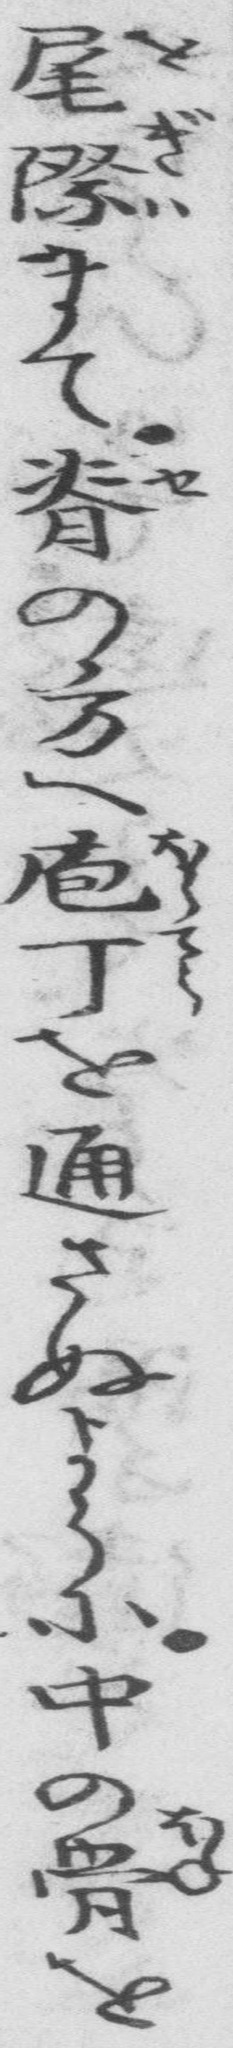尾際まて。背の方へ包丁を通さぬように。中の骨を
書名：萬寳料理秘密箱
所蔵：大阪府立大学学術情報センター 国文学研究資料館
